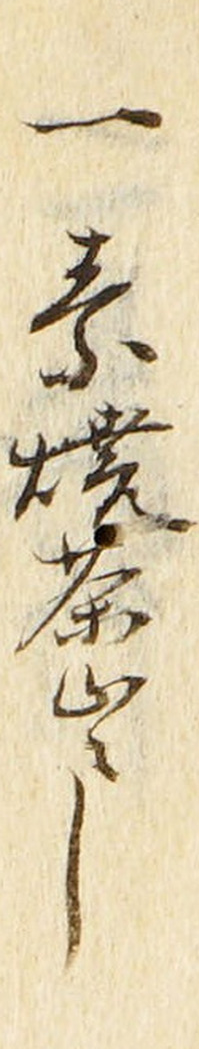一素焼茶山にし壱
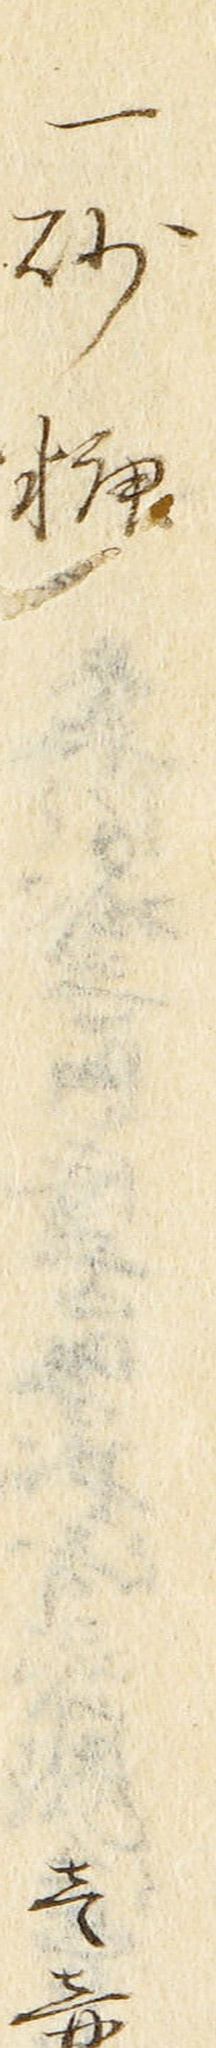一砂糖壱壺
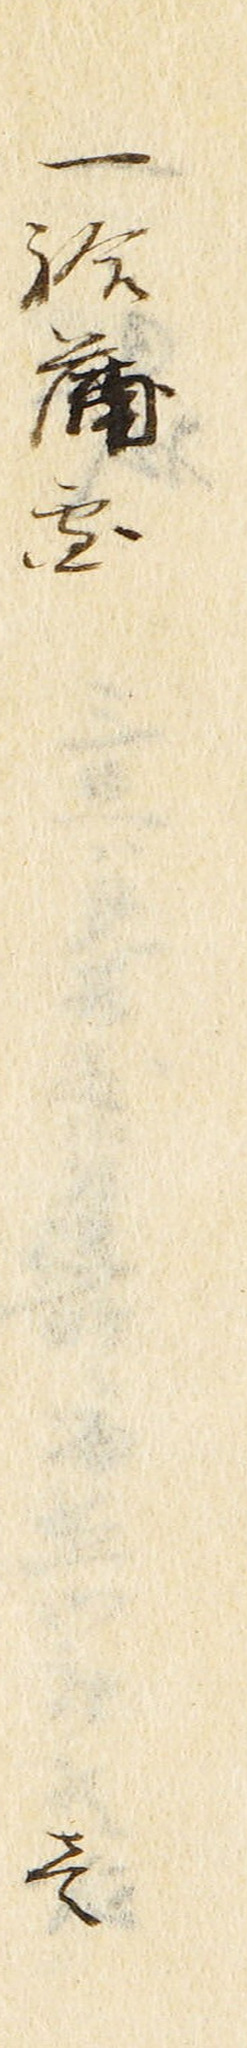一袷蒲団壱
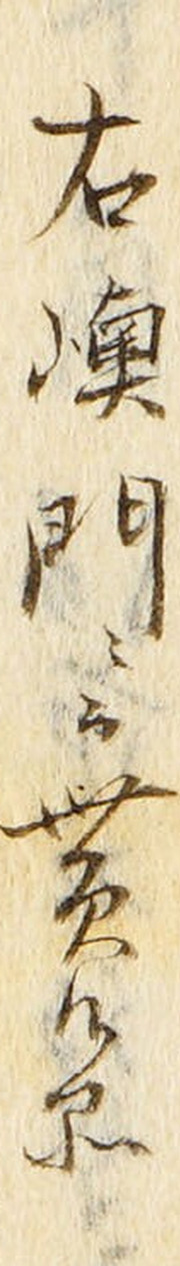右嶴門に而貰候品
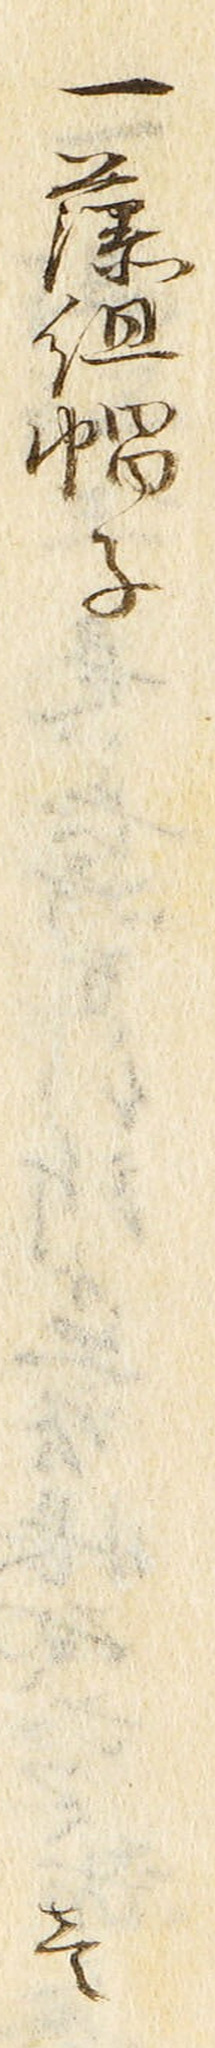一薸組帽子壱
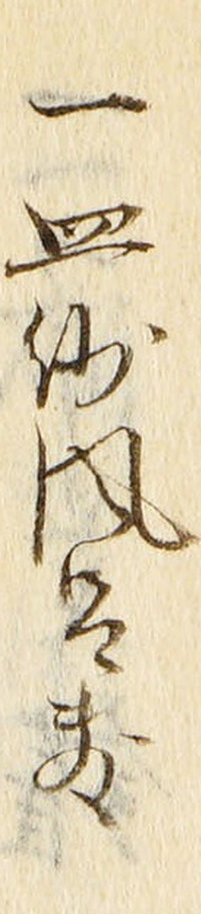一皿紗風呂敷壱
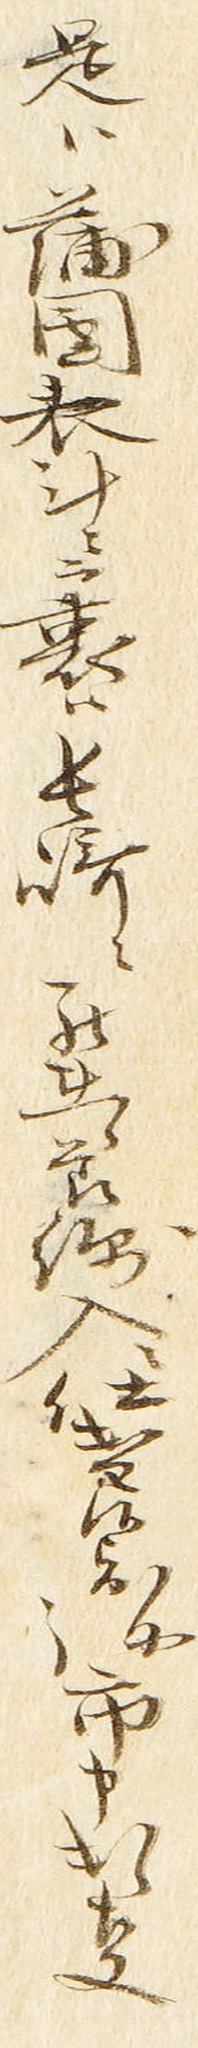是は蒲団表斗に而裏は長崎に罷在り節綿入に仕遣候旨弥市申出候事
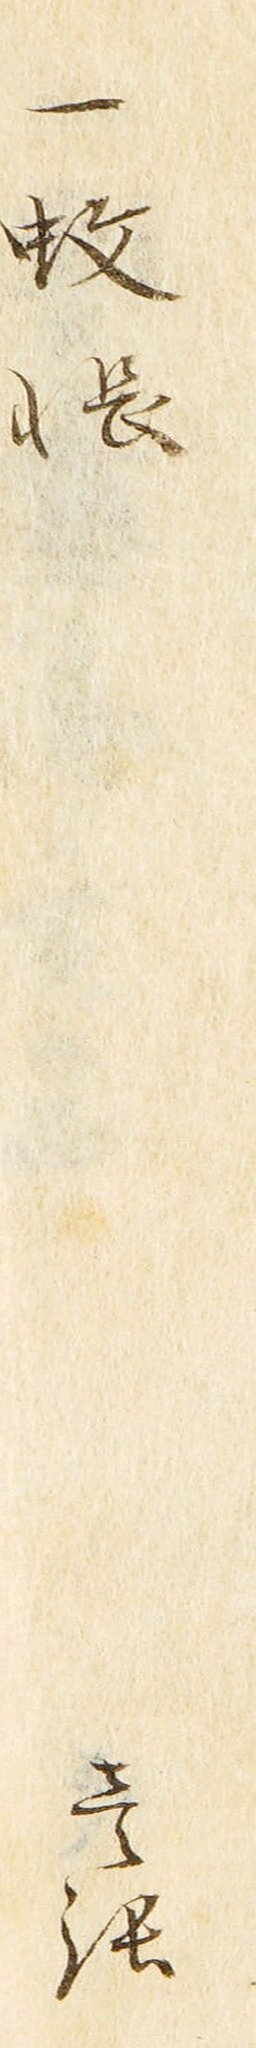一蚊帳壱張

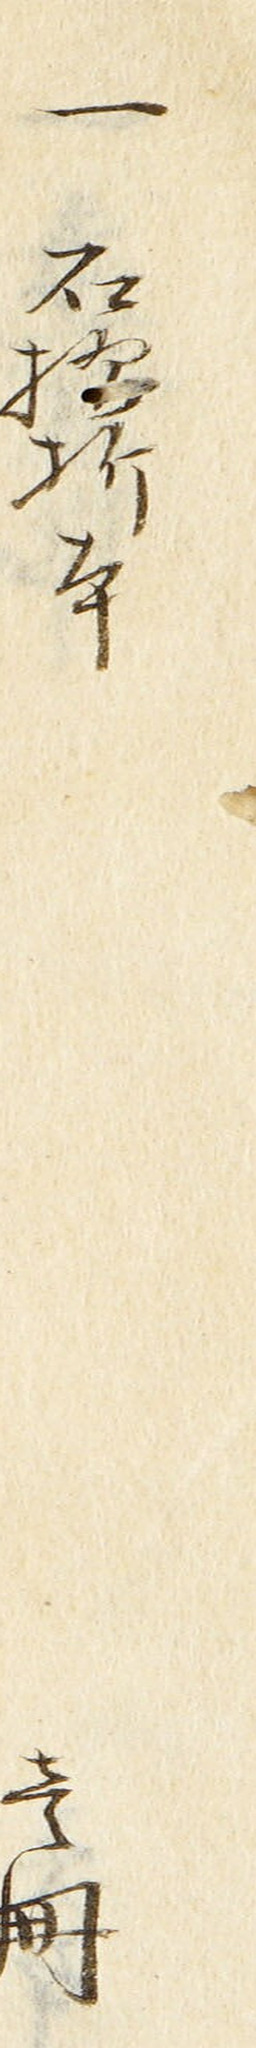一石擦折本壱冊
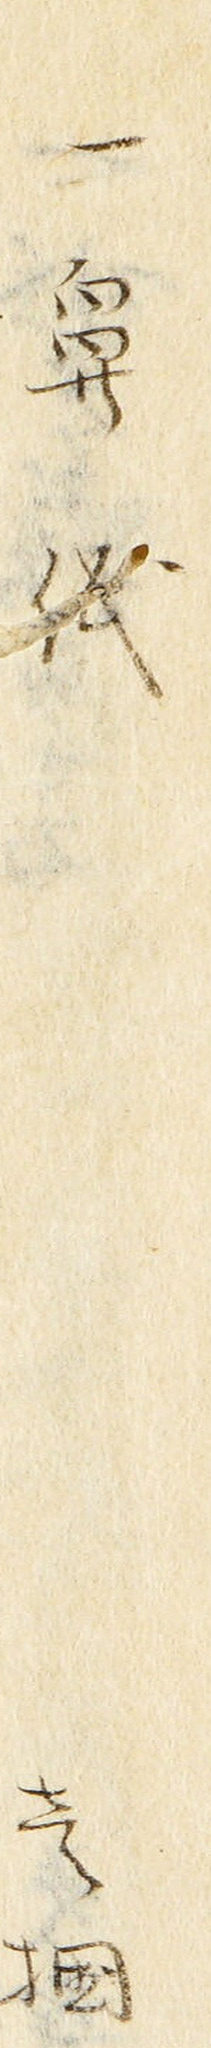一鼻紙壱掴
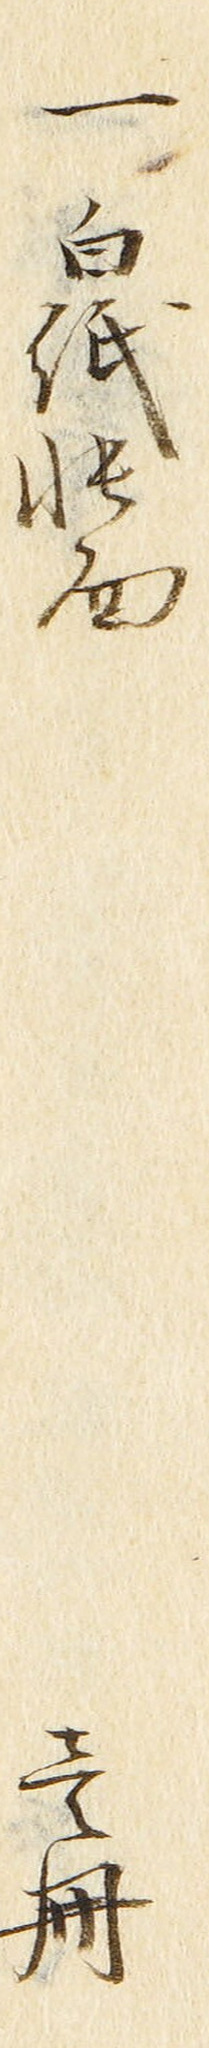一白紙帳面壱冊
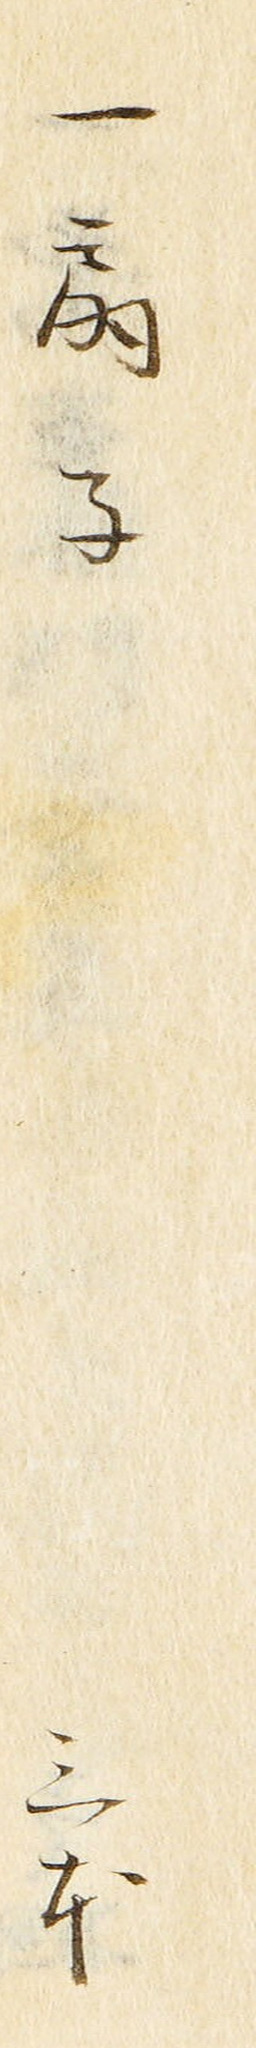一扇子三本
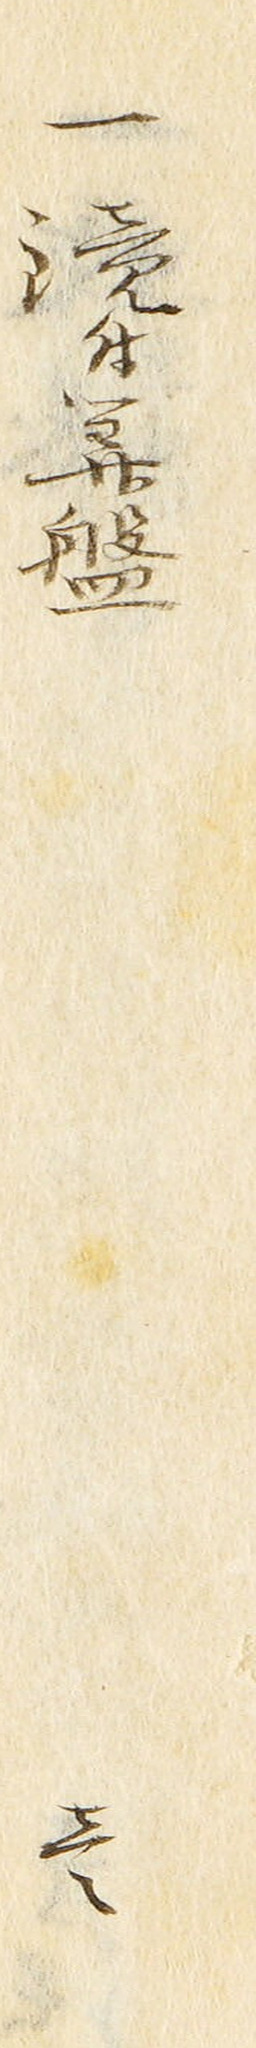一鏡付算盤壱
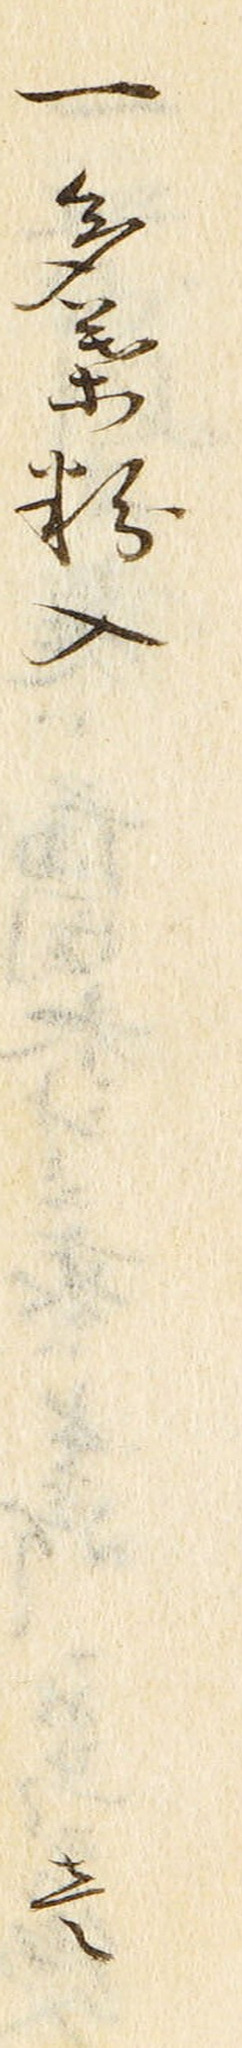一多葉粉入壱
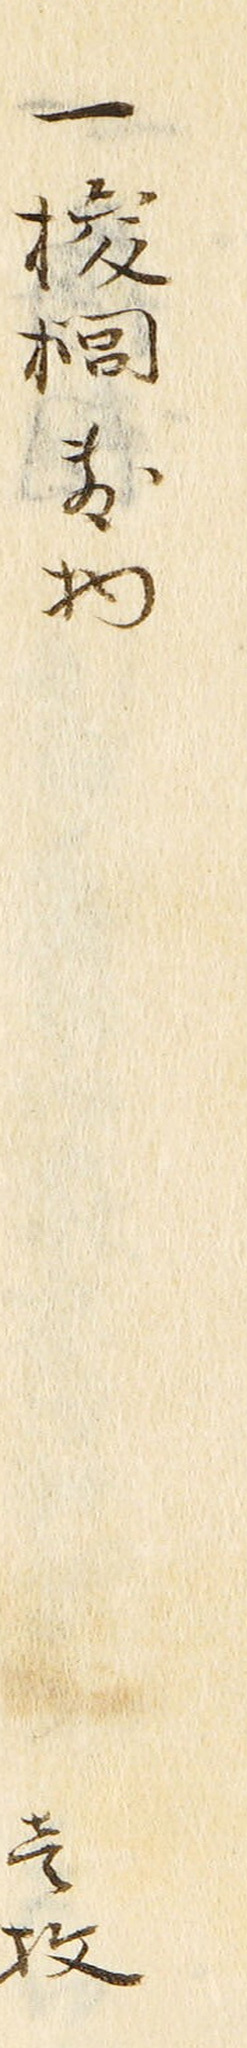一梭櫚敷物壱枚
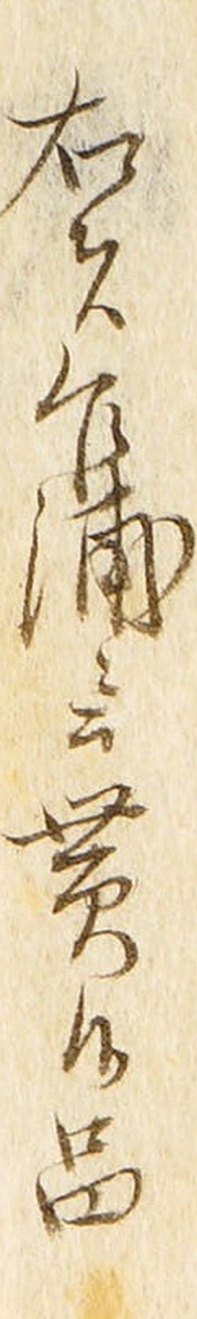右は乍浦に而貰候品
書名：長崎漂流記
